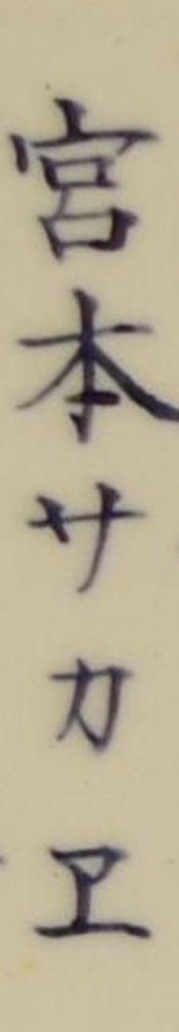宮本サカヱ
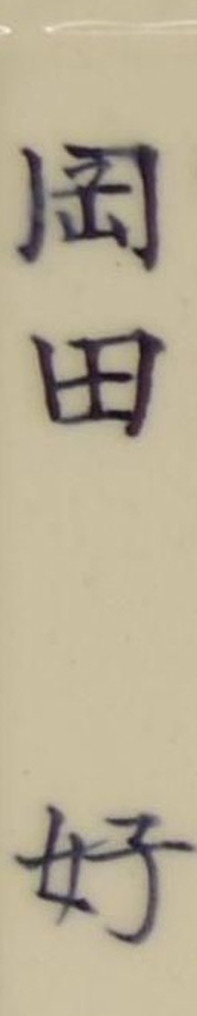岡田好

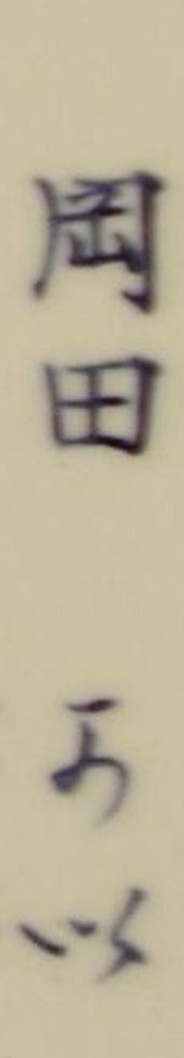岡田あい
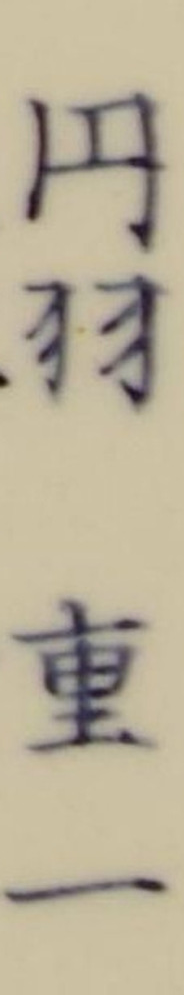丹羽重一
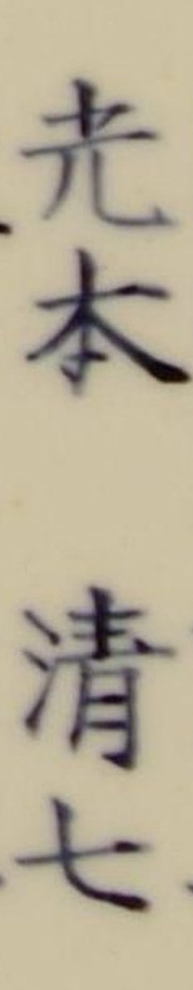光本清七
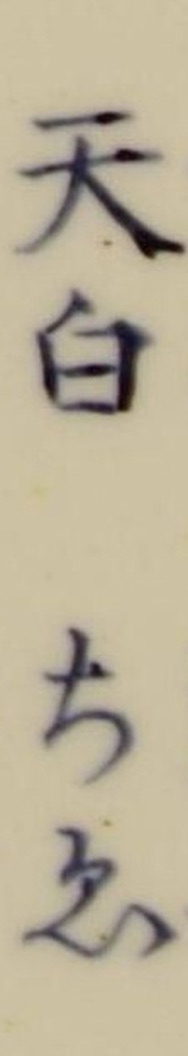天白ちゑ
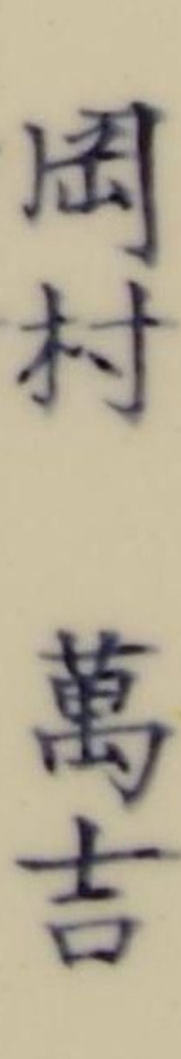岡村万吉
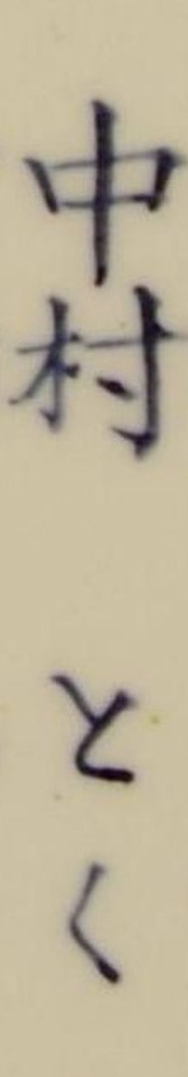中村とく
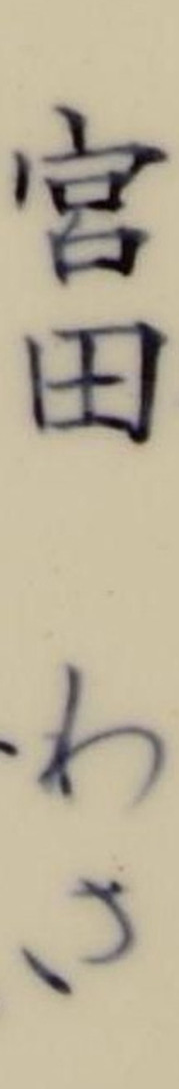宮田わさ
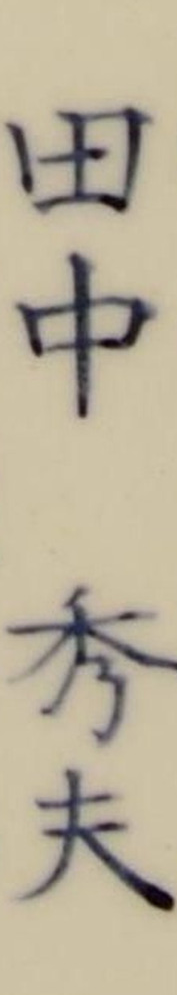田中秀夫
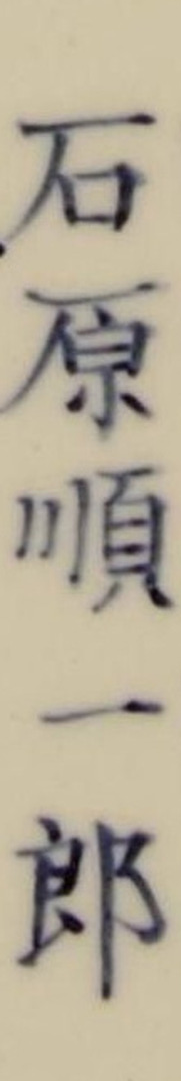石原順一郎
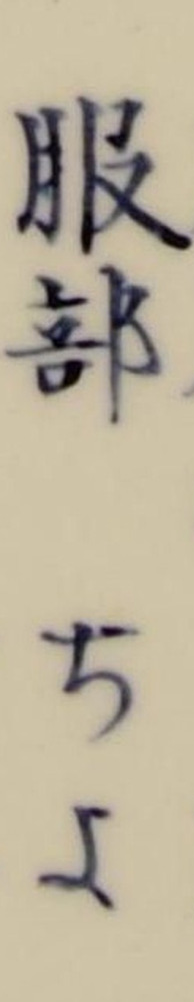服部ちよ
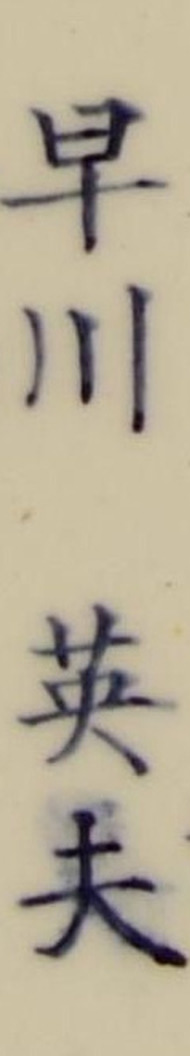早川英夫
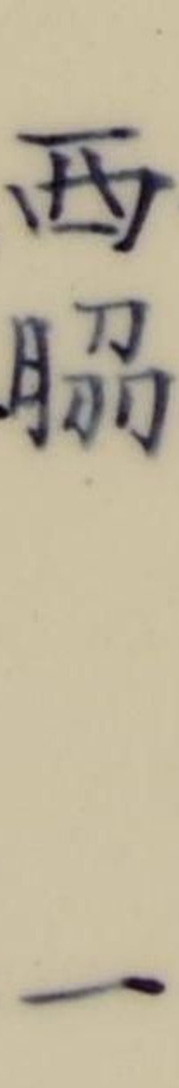西脇一
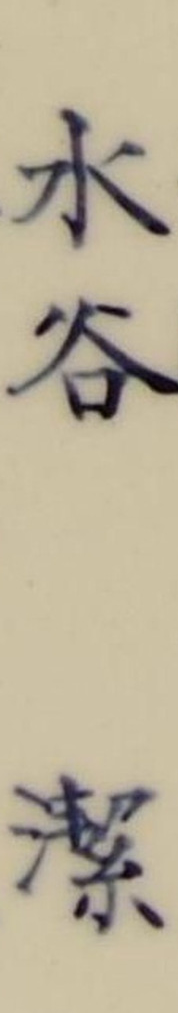水谷潔
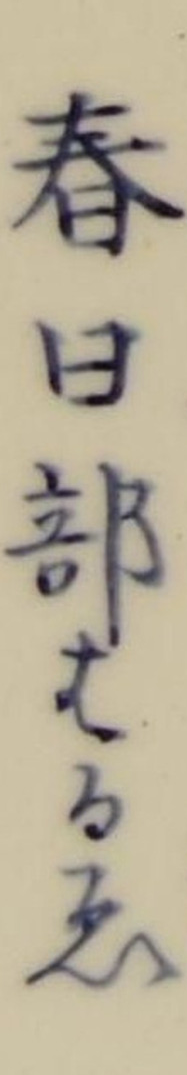春日部はるゑ
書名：E~L
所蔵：高野山金剛峯寺
